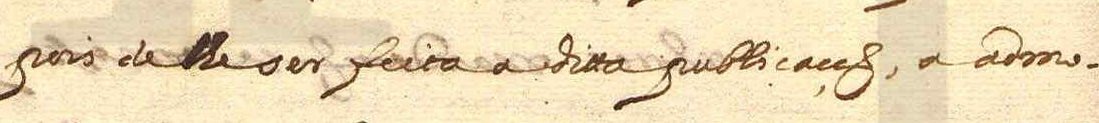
pois de lhe ser feita a ditta publicaçaõ, a admo
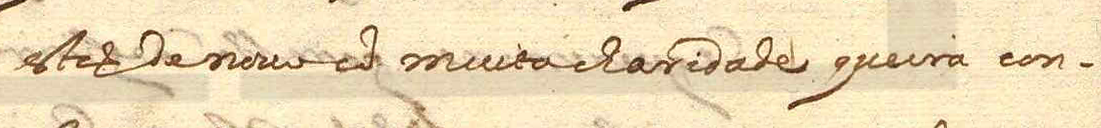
estaõ de nouo cō muita charidade queira con
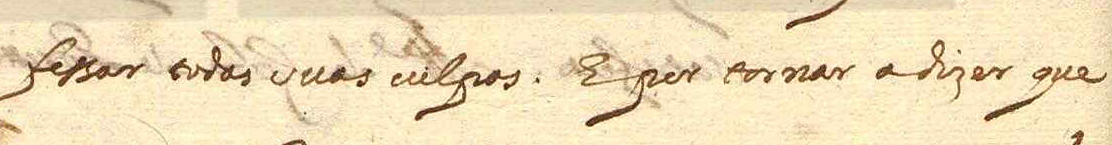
fessar todas suas culpas. E por tornar a dizer que
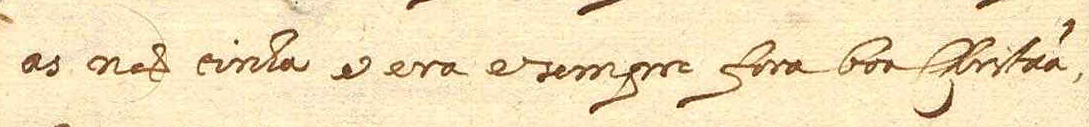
as naõ tinha e era e sempre fora boa Christaã
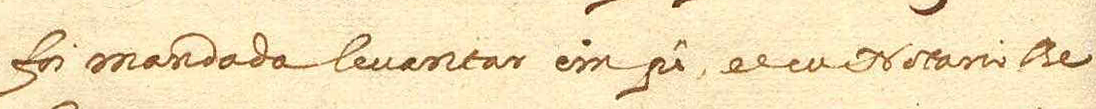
foi mandada leuantar em pé, e eu Notario lhe
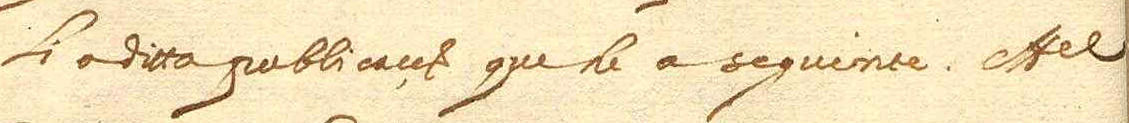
li a ditta publicaçaõ que he a seguinte. Mel
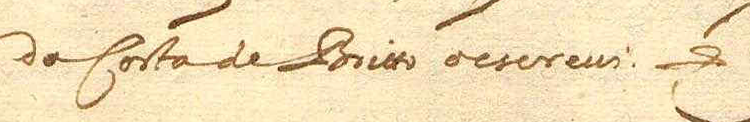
da Costa de Britto o escreui. -
